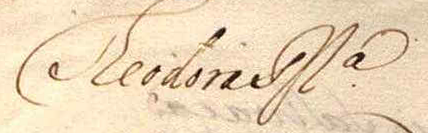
Theodora Ma.
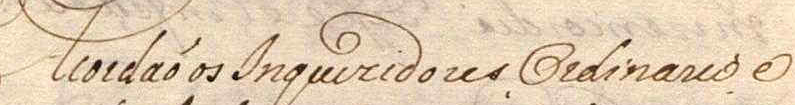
Acordaõ os Inquizidores Ordinario e
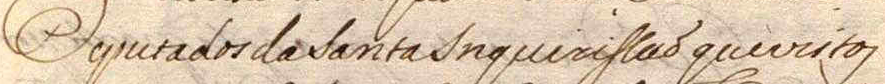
Deputados da Santa Inquizissaõ que vistos
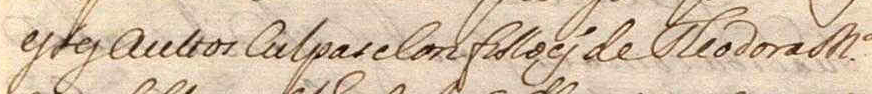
estes Auttos Culpas e Confissoẽs de Theodora M.a
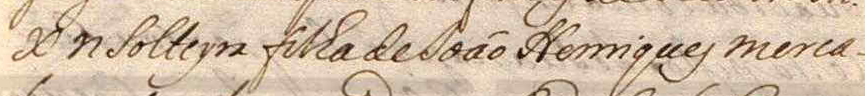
xn Solteyra filha de Ioão Henriques merca
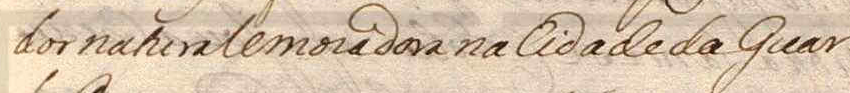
dor natural e moradora na Cidade da Guar
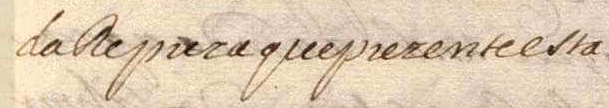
da Re preza que prezente está
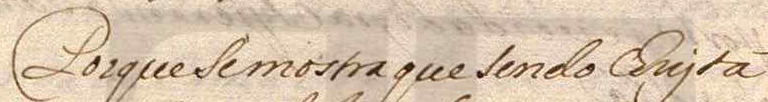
Porque se mostra que sendo Cristã
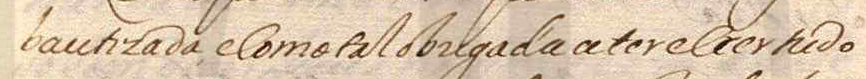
bautizada, e Como tal obrigada a ter e Crer tudo
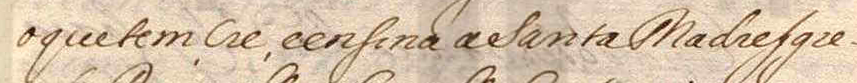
o que tem, cre, e ensina a Santa Madre Jgre
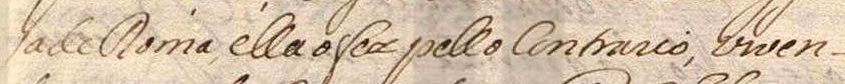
ja de Roma, ella o fez pello Contrario, viven
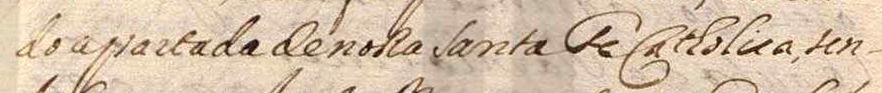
do apartada de nossa santa Fe Catholica, ten
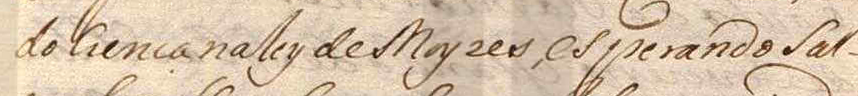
do Crença na ley de Moyzes, esperando sal
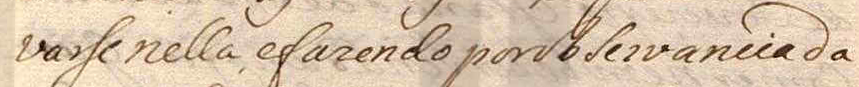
varse nella, e fazendo por observancia da
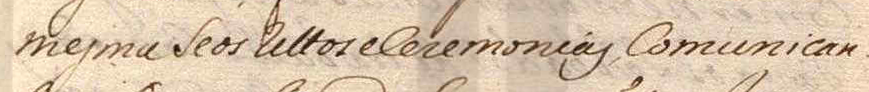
mesma seos Rittos e Ceremonias, Comunican
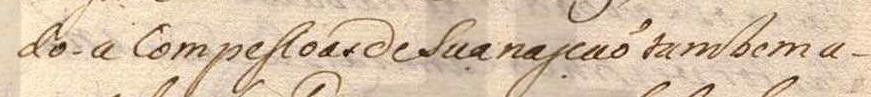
do-a Com pessoas de Sua nasçaõ tambem a
